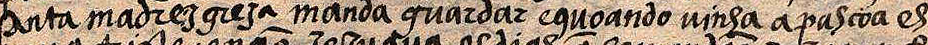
santa madre JgreJa manda guardar e quoando uinha a pascoa es
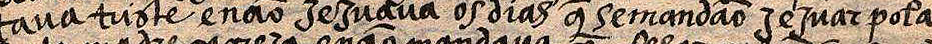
taua triste e naõ JeJuaua os dias q̄ se mandão JeJuar pola
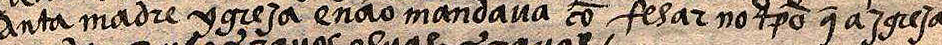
santa madre ygreJa e não mandaua cō fesar no tpō q̄ a JgreJa
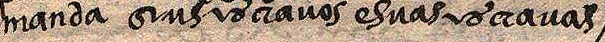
manda seus escrauos e suas escrauas/
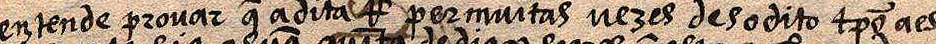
emtende prouar q̄ a dita R per muitas uezes des o dito tpō a es
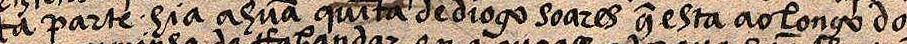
ta parte : hia a huā quīta de diogo soares q̄ esta ao longo do
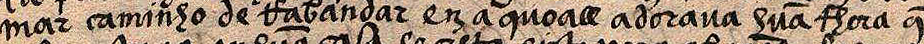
mar caminho de Rabandar em a quoall adoraua huā thora q̄
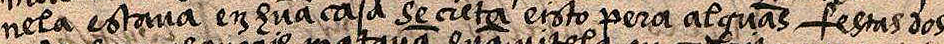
nela estaua em huā casa secreta e isto pera alguās festas dos
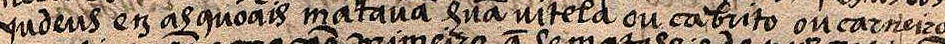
Yudeus em as quoais matauā huā uitela ou cabrito ou carneiro
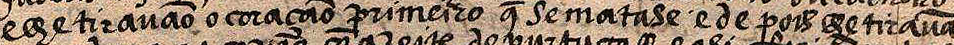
e lhe tirauão o coração primeiro q̄ se matase e depois lhe tiraūa
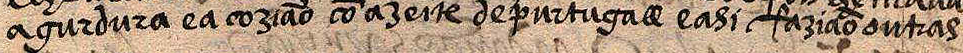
a gurdura e a cozião cõ azeite de purtugall e asi faziaõ outras
